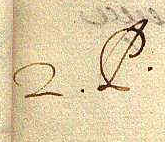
2. P.
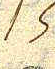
15
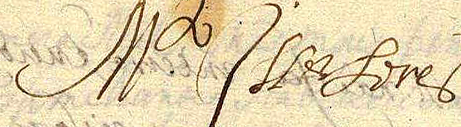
M.to Jlles sorēs
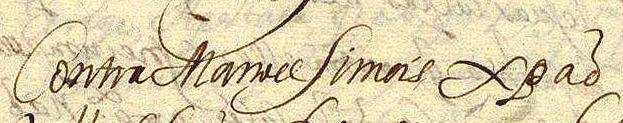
Contra Manoel Simois Xpaõ
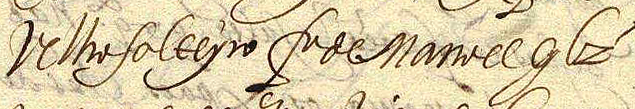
Velho solteyro fo de Manoel glz̄
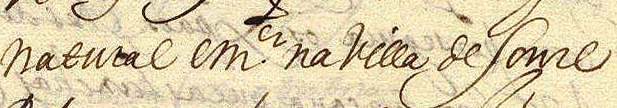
natural e m.or na Villa de Soure
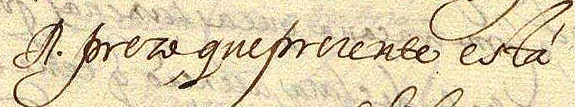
R. prezo, que prezente está
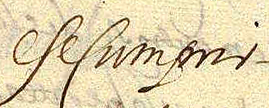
e se Cumprir
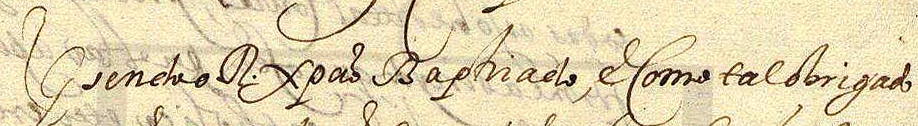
Q̄ sendo o R. Xpaõ Baptizado, e Como tal obrigado
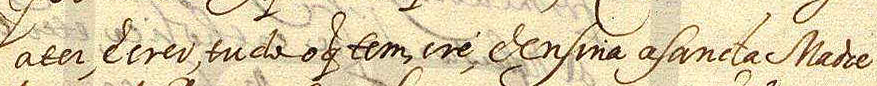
a ter, e crer, tudo o q̄ tem, cre, e ensina a Sancta Madre
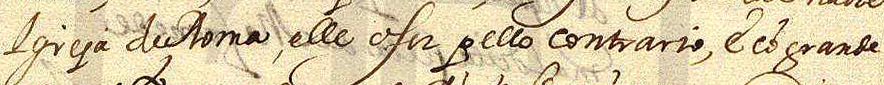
Igreja de Roma, elle o fez pello contrario, e cō grande
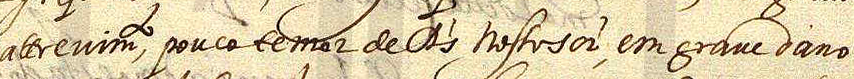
attreuimto, pouco temor de Ds̄ nosso sor̄, em graue dano
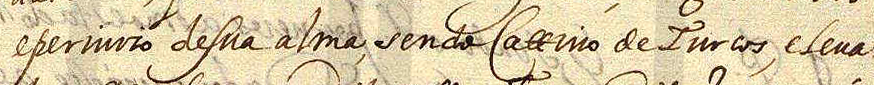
e periuizo de sua alma, sendo Cattiuo de Turcos, e leua
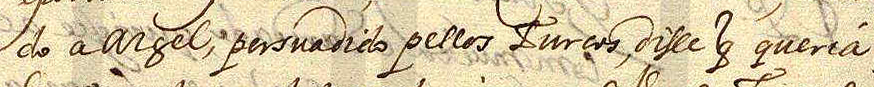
do a argel, persuadido pellos Turcos, disse q̄ queria
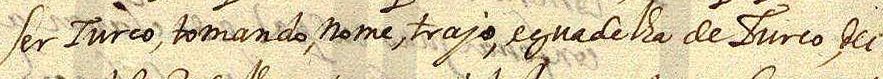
Ser Turco, tomando nome, trajo, e guadelha de Turco, dei
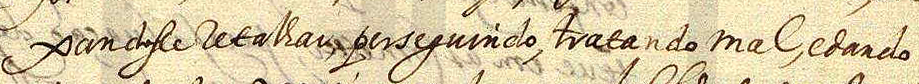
xandosse retalhar, perseguindo, tratando mal, e dando
